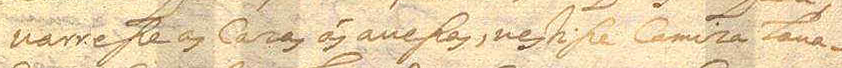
uarresse as Cazas ás auessas, uestisse Camiza Laua
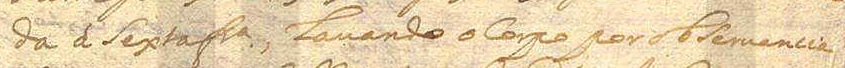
da á Sexta fr.a, Lauando o Corpo por obseruancia
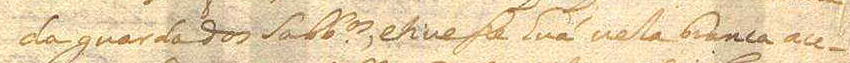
da guarda dos sabb.os, e tivesse huā uela branca ace
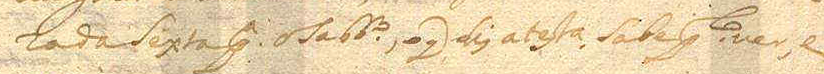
za da Sexta p.a o Sabb.o, e q̄ dis a testa. sabe plo. ver, e
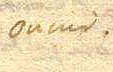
ouuir.
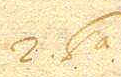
2. Ta
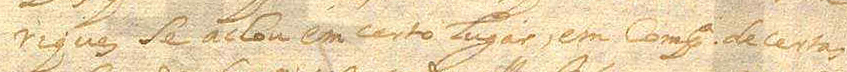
riques se achou em certo Lugar, em Comp.a de certas
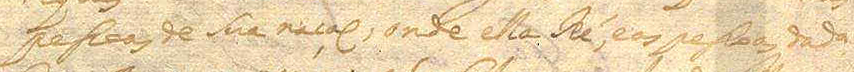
pessoas de sua naçā, onde ella Ré, e as pessoas da da
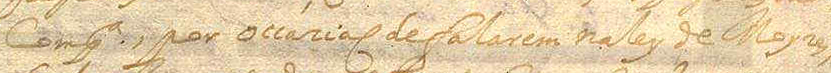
Comp.a, por occaziā de falarem na ley de Moyzes
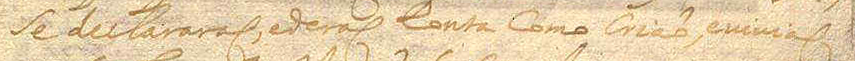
se declararā, e derā Conta Como criaõ, e uiuiā
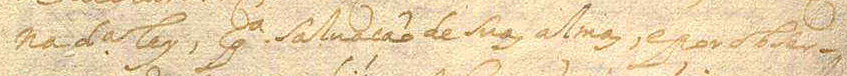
na d.a ley, pa saluaçaõ de suas almas, e por obser
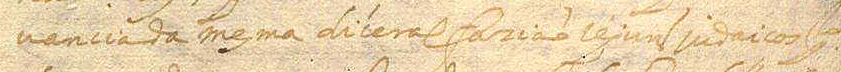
uancia da mesma dicerā faziaõ iejuns judaicos plo
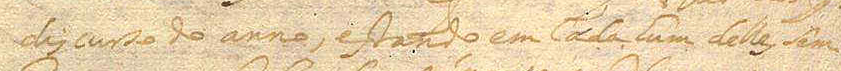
discurso do anno, estando em Cada hum delles sem
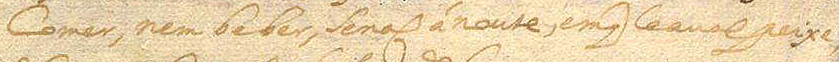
Comer, nem beber, senā á noute, em q̄ Ceauā peixe,
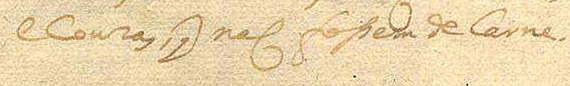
e Couzas, q̄ nā fossem de Carne.
